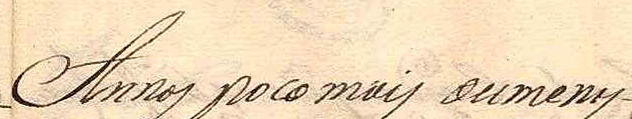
Annos poco mais ou menos
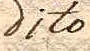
dito
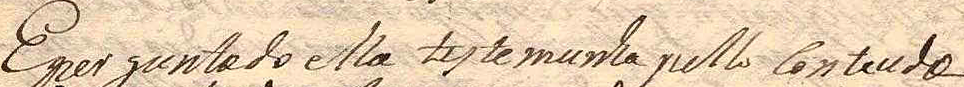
E perguntado ella testemunha pello Conteudo
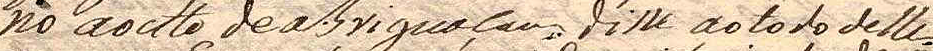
no aoctto de abriguaçam disse ao todo delle
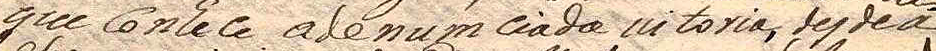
que conhece a denumciada uitoria, desde á
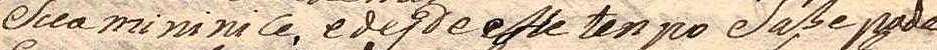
sua mininice, e desde este tenpo sabe pade
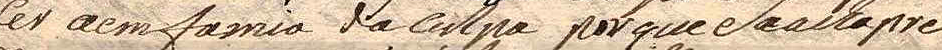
cer a emfamia da culpa porque se acha pre
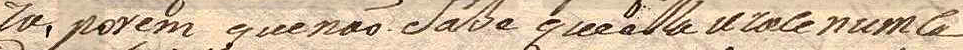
za, porem que naõ sabe que ella uzace numca
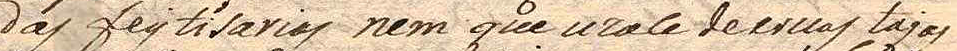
das feytisarias nem que uzace de eruas tajas
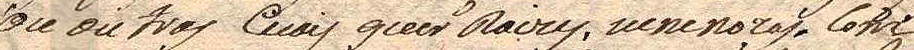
ou outras cuaisquer Raizes, uenenozas, com
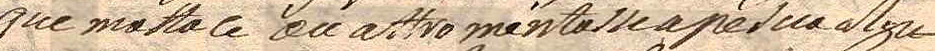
que mattace ou attromentasse a pesua algu
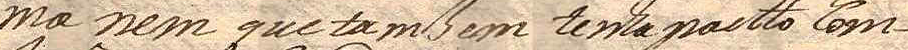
ma nem que tambem tenha pactto com
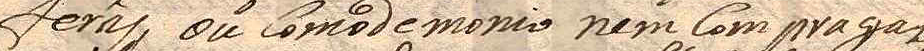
ferás ou Com o demonio nem Com pragas
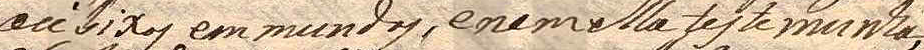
ou bixas emmundas, e nem ella testemunha,
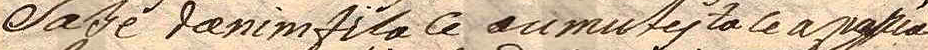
sabe danimfiçace ou mutestace a pessua
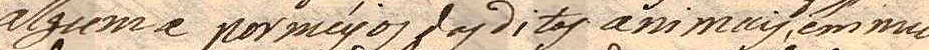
alguma por meyos dos ditos animais, em mu
